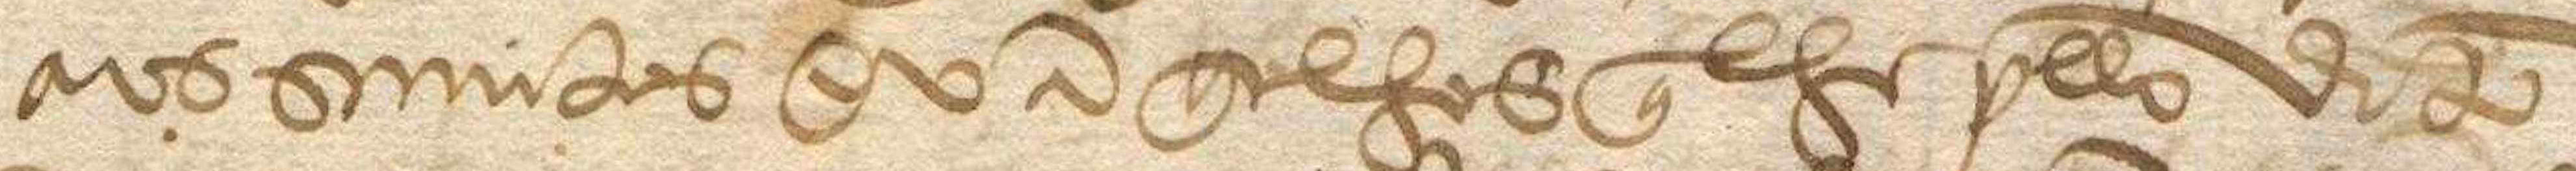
aos samtos evāgelhos q̄ lhe p̄llo dito
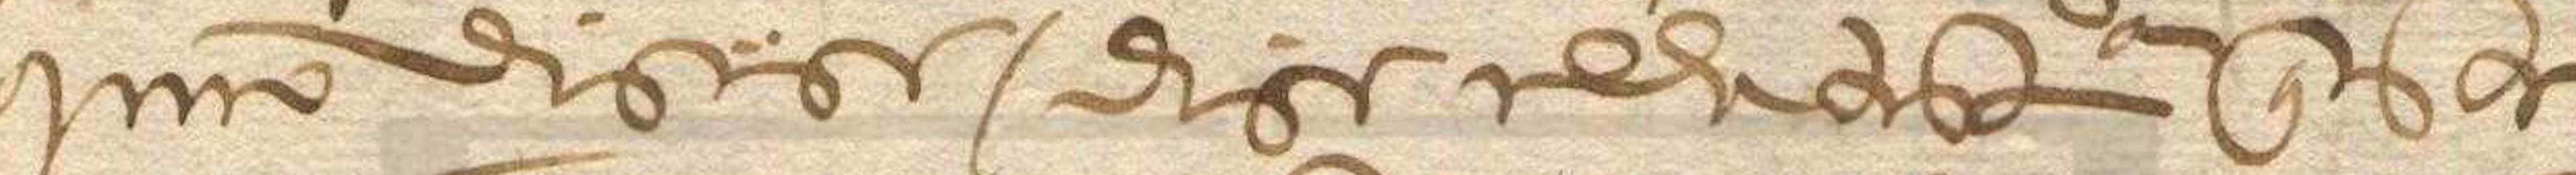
que o disese / dise ella testa q̄ este
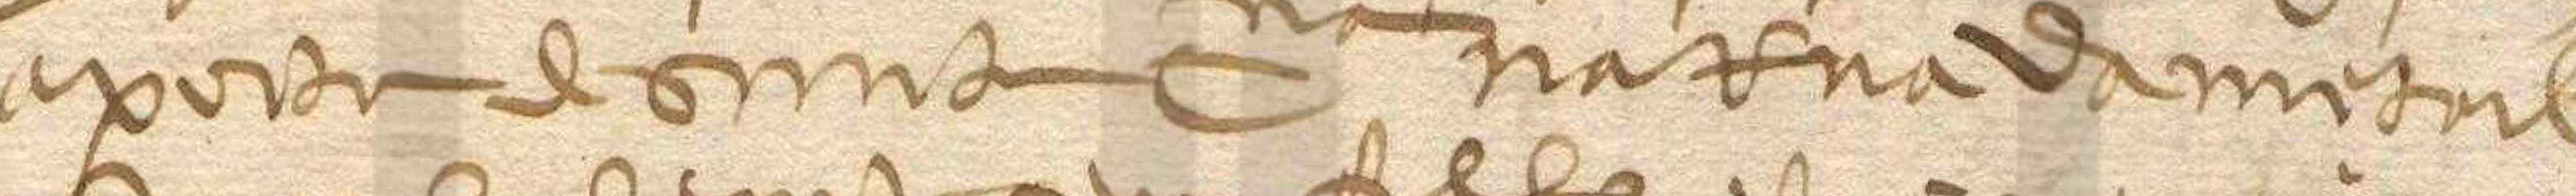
a porta de samta Cna na Rua dametade
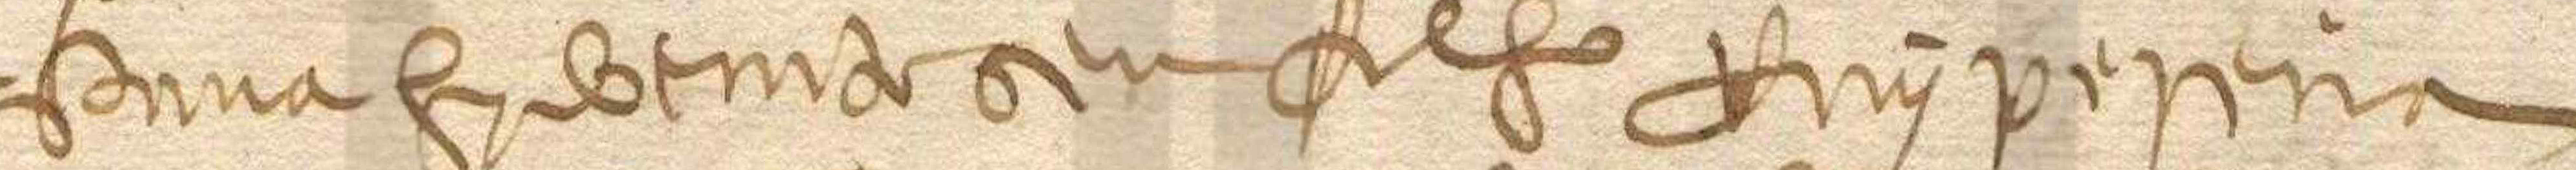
estaua hy doemte seu filho Ruy pereira
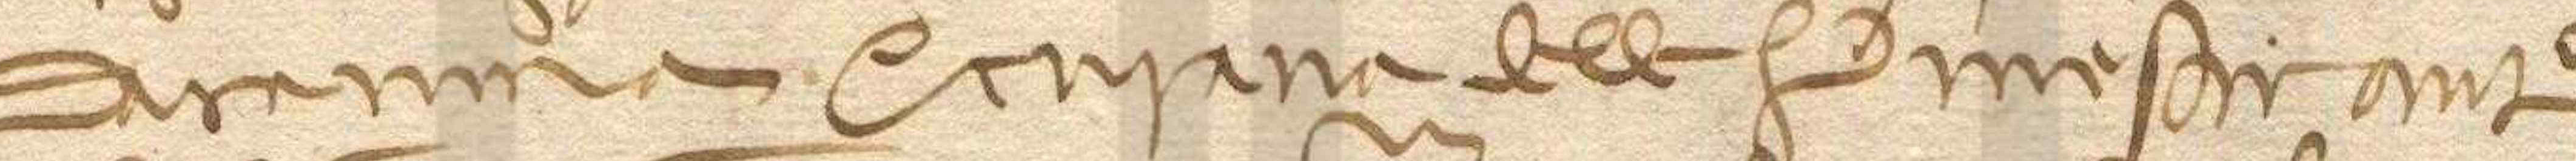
da camera e curaua delle hū mestre anto
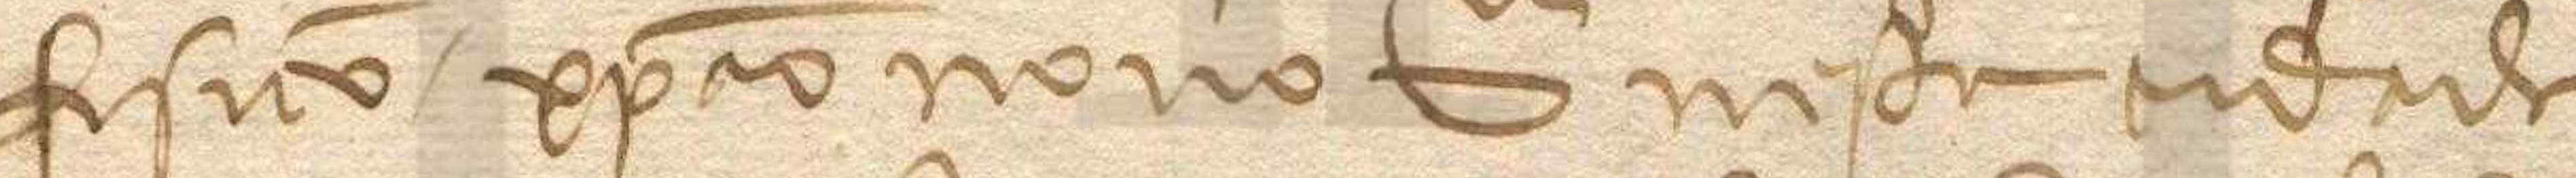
fisico / xpão nouo mor nesta cidade
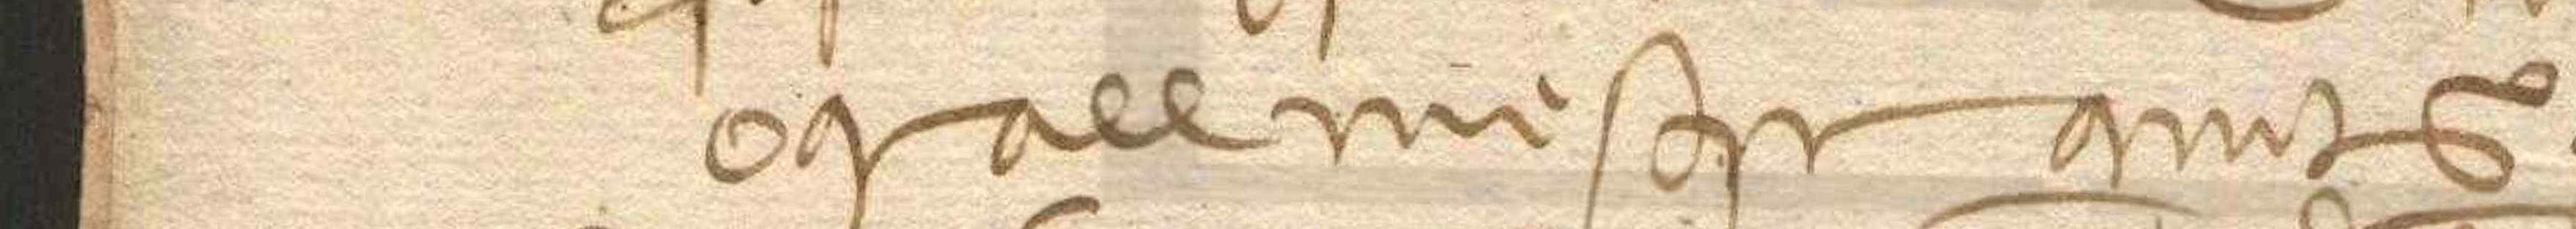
o quall mestre amto . estando huā
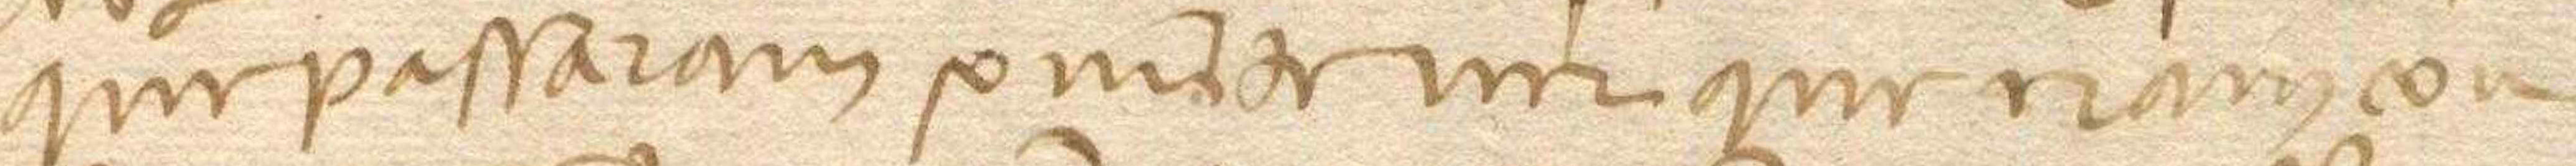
que passaram somēte uer que eram cou
